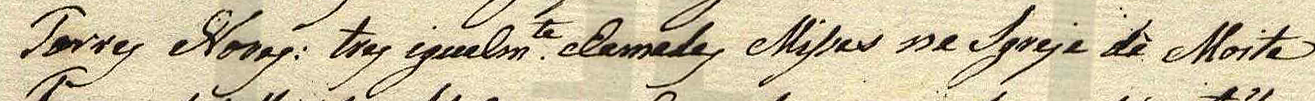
Torres Novas: tres igualm.te chamadas Missas na Igreja da Moita
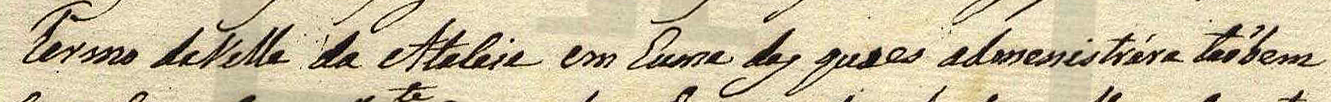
Termo da Villa da Atalaia em huma das quaes administrára taõbem
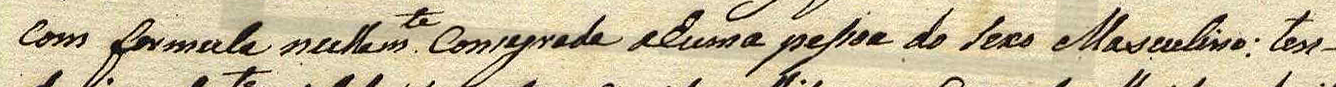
com formula nullam.te consagrada a huma pessoa do sexo Masculino: ten
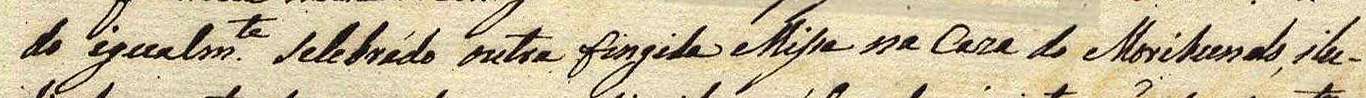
do igualm.te selebrádo outra fingida Missa na Caza do Moribundo, ilu
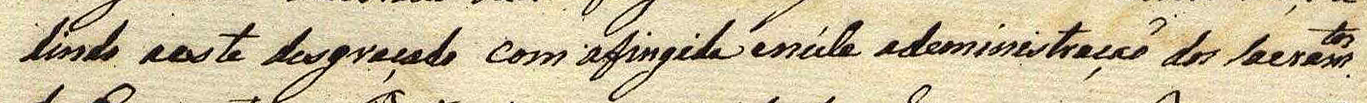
dindo a este desgraçado com a fingida e nula adeministraçaõ dos sacram.tos
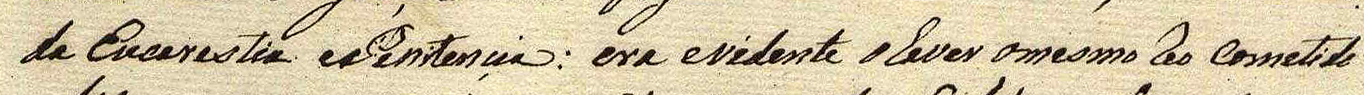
da Eucarestia e Penitencia: era evidente o haver o mesmo Reo cometido
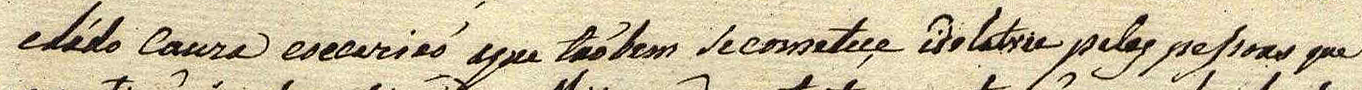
e dádo cauza e occaziaõ a que taõbem se cometece idolatria pelas pessoas que
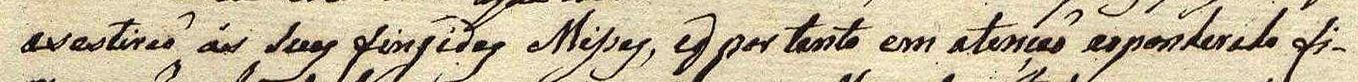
asestiraõ ás suas fingidas Missas, e q̄ portanto em atençaõ ao ponderado fi
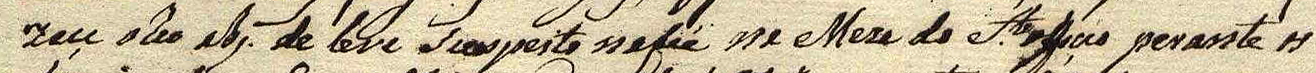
zece o Reo abj. de leve suspeito na feé na Meza do S.to officio perante os
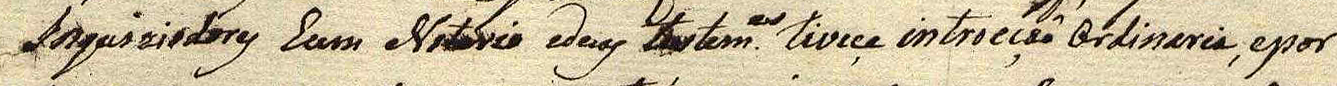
Inquiziodores hum Notario e duas testem.as tivece introcçaõ ordinaria, e por
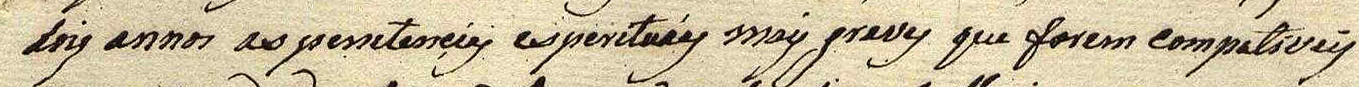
dois annos as penetencias esperituáes mais graves que forem compativeis
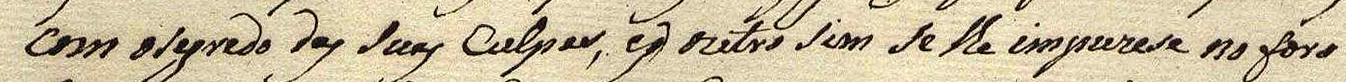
com o segredo das suas culpas, e q̄ outrosim se lhe impuzese no foro
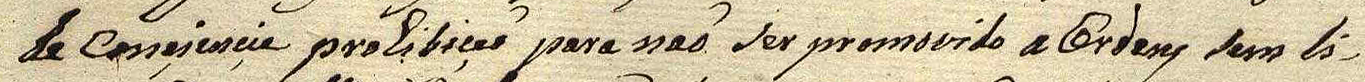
de conciencia prohibiçaõ para naõ ser promovido a Ordens sem li
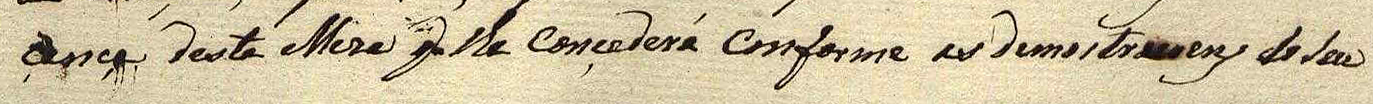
cença desta Meza q̄ lha concederá conforme as demostraçoens do seu
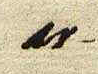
ar
